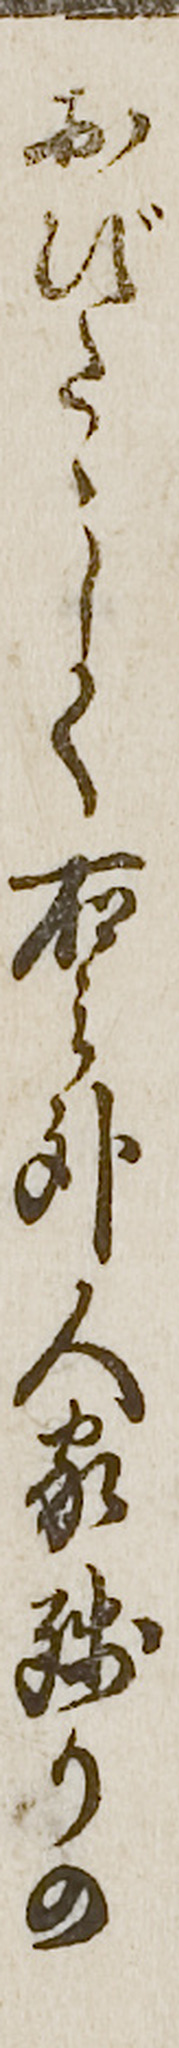おびたゝしく右之外人家残りの
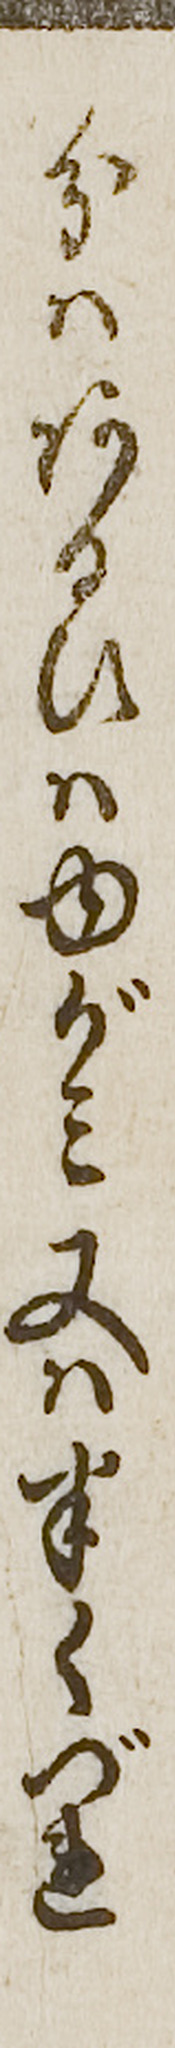分はあるひはゆがみ又は半くづれ
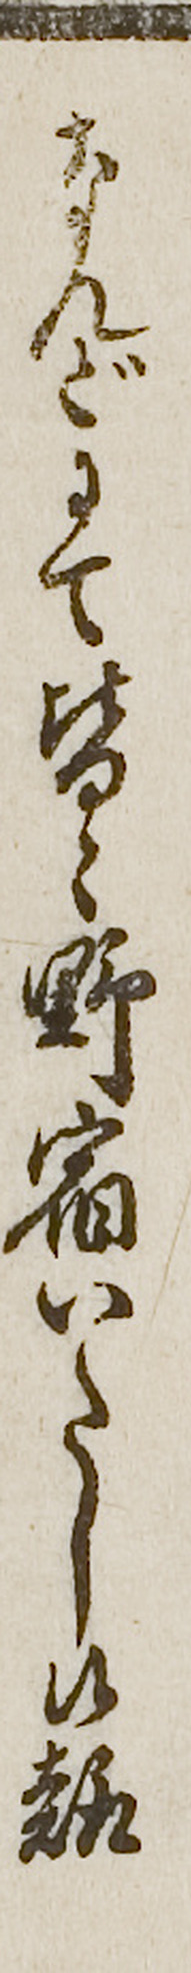なんどにて皆々野宿いたし候趣
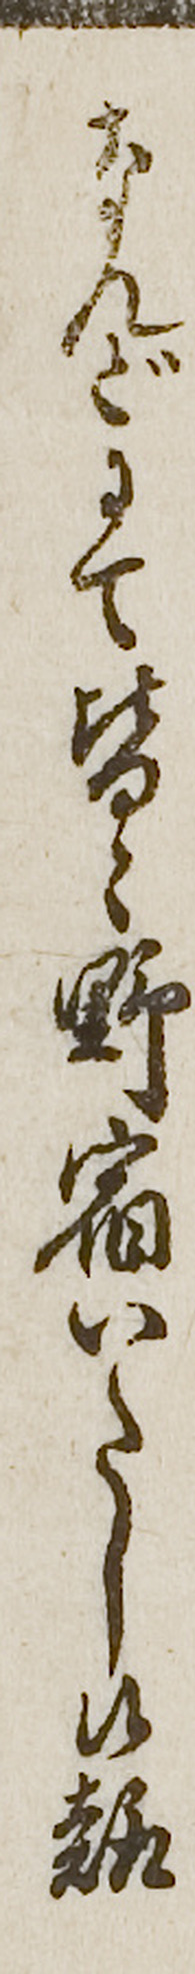なんどにて皆々野宿いたし候趣
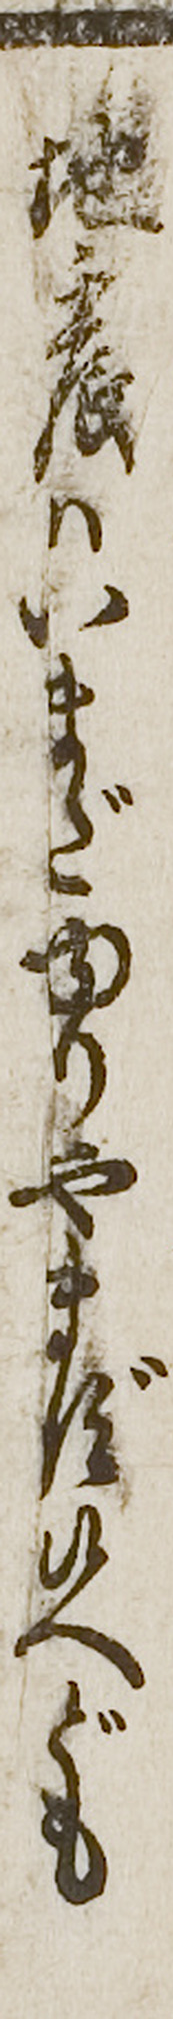地震はいまだゆりやまず候へども
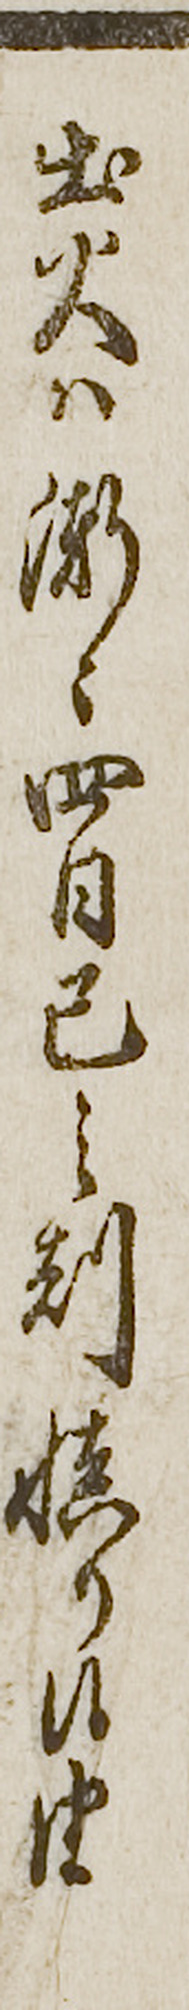出火は漸々四日巳之刻慎り候由
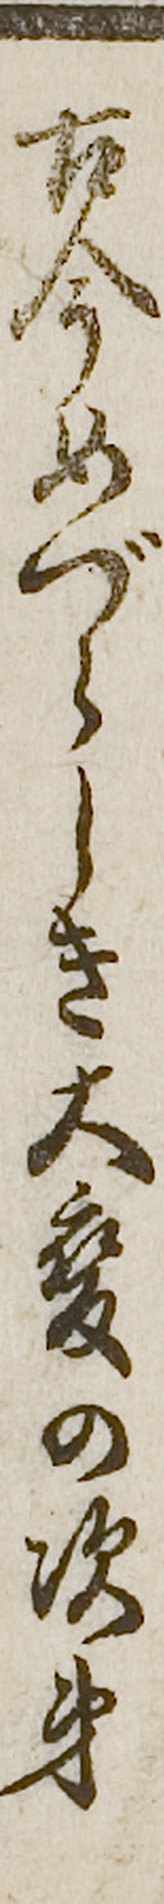古今めづらしき大変の次第
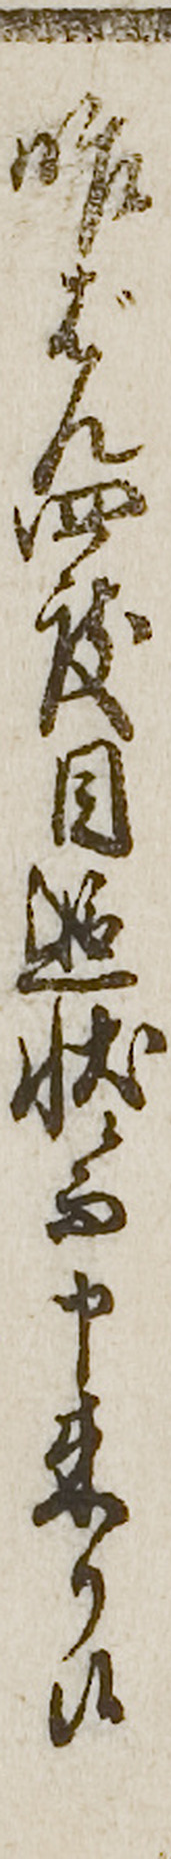昨ばん四度目追状ニ而申来り候
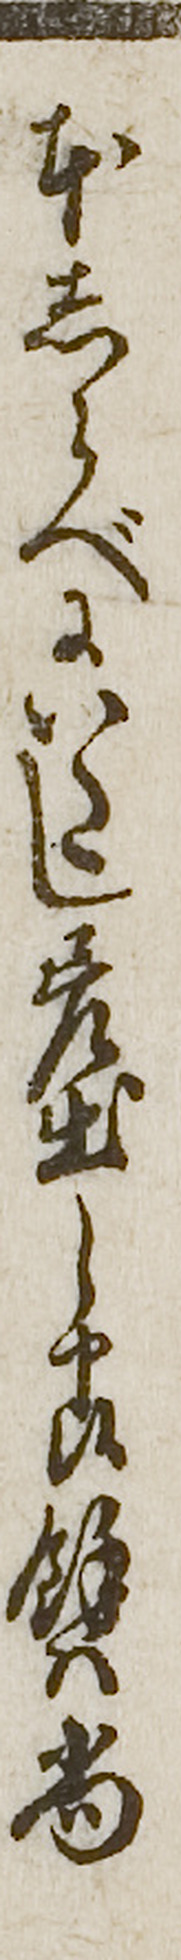本しらべにいたし差出し申候余は尚
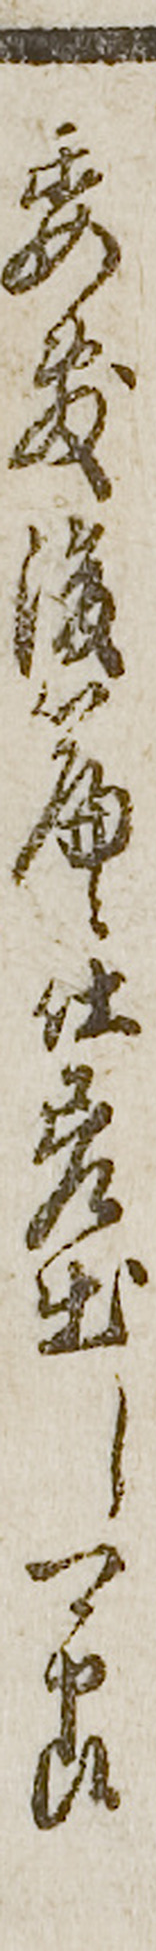委敷後篇に仕差出し可申候
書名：江戸大地震出火本しらべ
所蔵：東京大学総合図書館 General Library in the University of Tokyo, JAPAN
